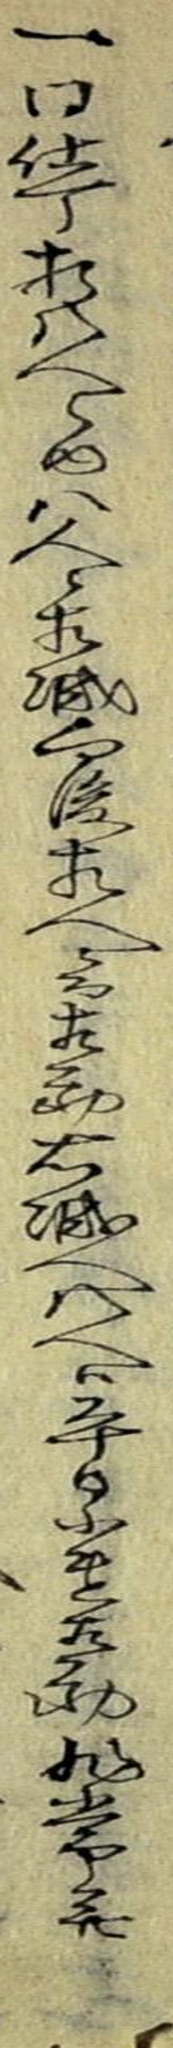一同仕丁拾八人之内八人ニ相減向後拾人ニ而相勤右減人八人ハ平日小遣相勤非常并
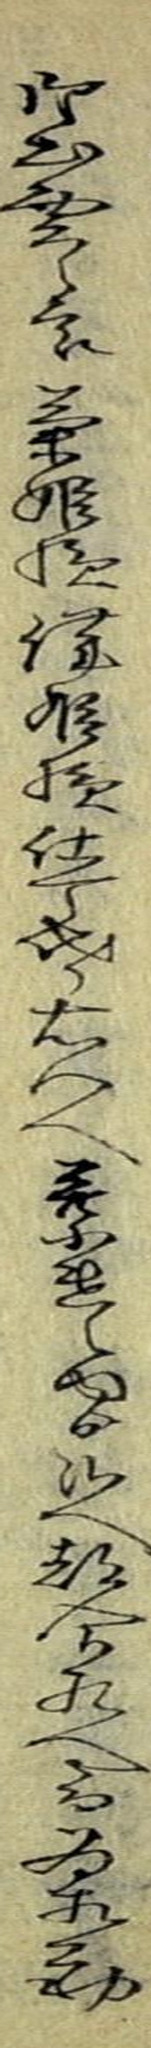御出殿之節菊姫様謹姫様仕丁代り右八人并小遣之内ゟ弐人都合拾人ニ而為相勤
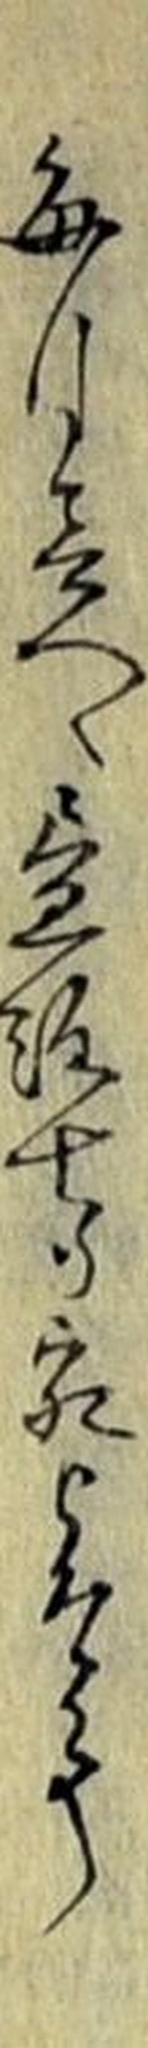毎月壱人へ昼飯七ツ宛被下候事
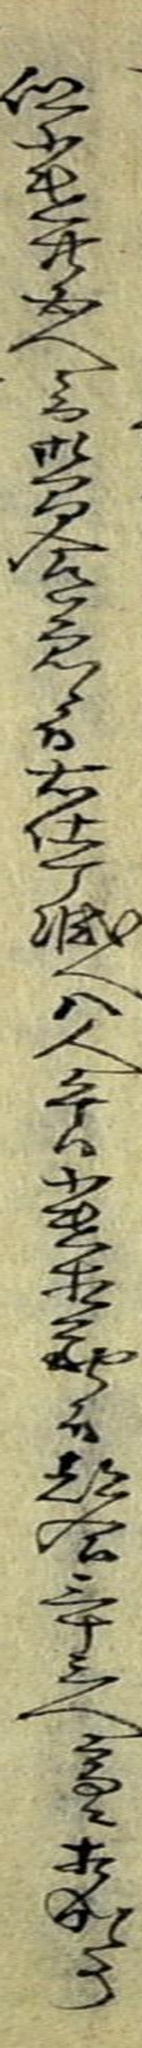但小遣共五人ニ而御間合兼ニ付右仕丁減人八人平日小遣相勤ニ付都合三十三人高ニ相成候事
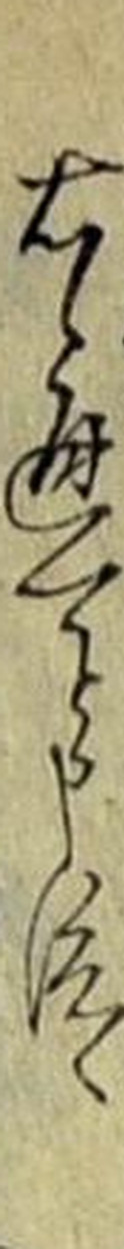右之通可被申渡候
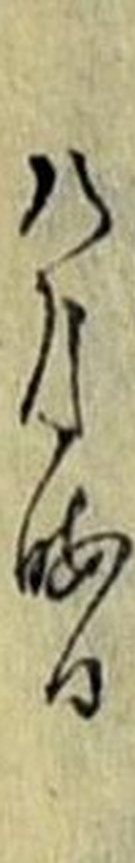八月晦日
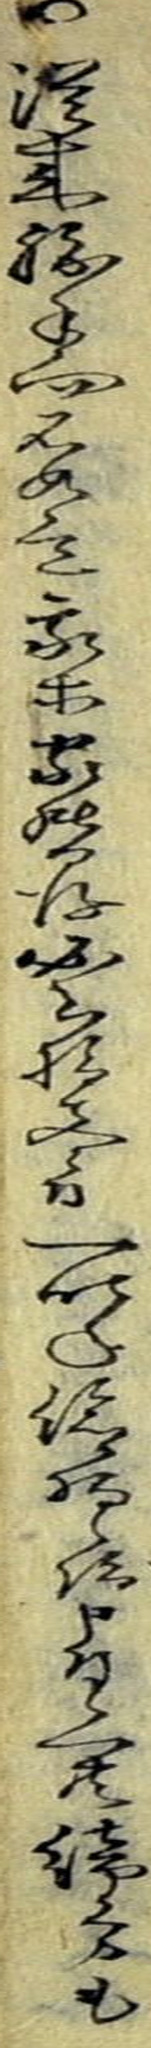○従来勝手向不如意我等家督後必至指支ニ付一昨年倹約之儀申付候へ共締方も
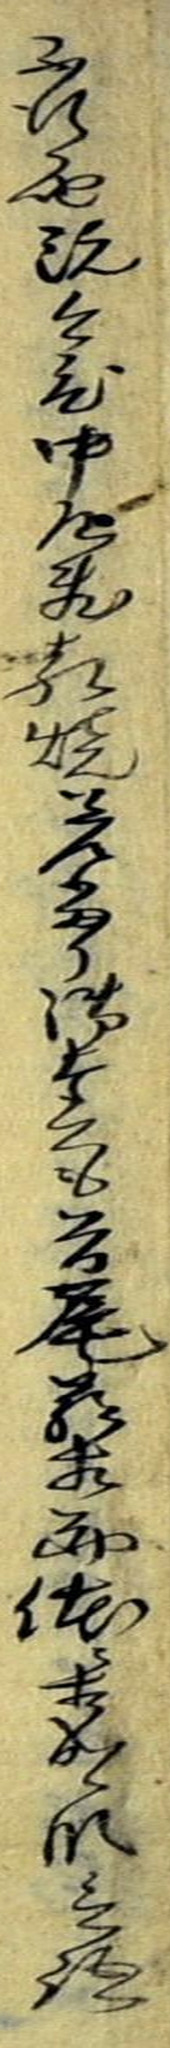不行届既今度中屋敷類焼差当り御奉公も首尾難相勤体ニ相成候段言語

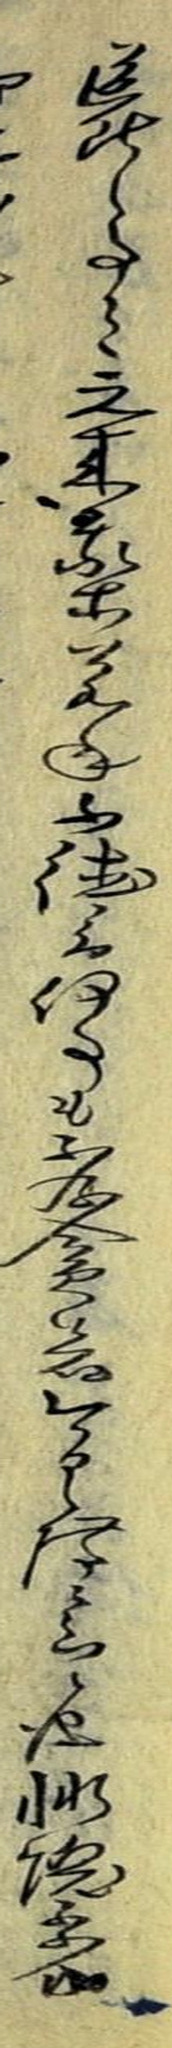道断之事ニ候元来我等若年不徳ニ而何事も不及貪着今日之儘ニ至候儀慚愧不少候
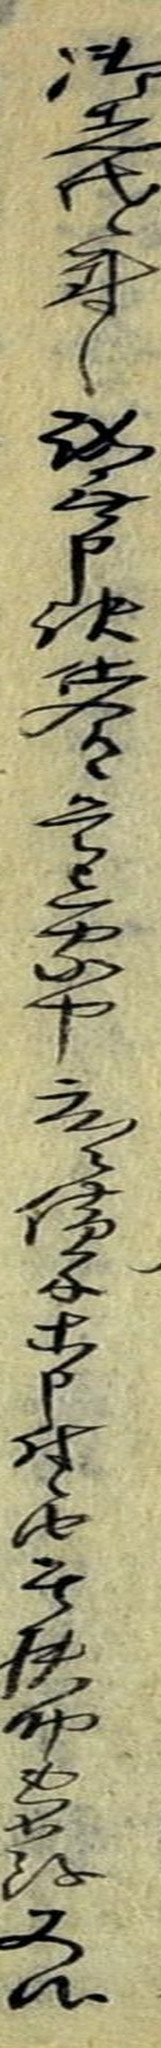御先代へ対し誠無申訳仕合候是迄家中度々借米等申付候由扶助も不致又候
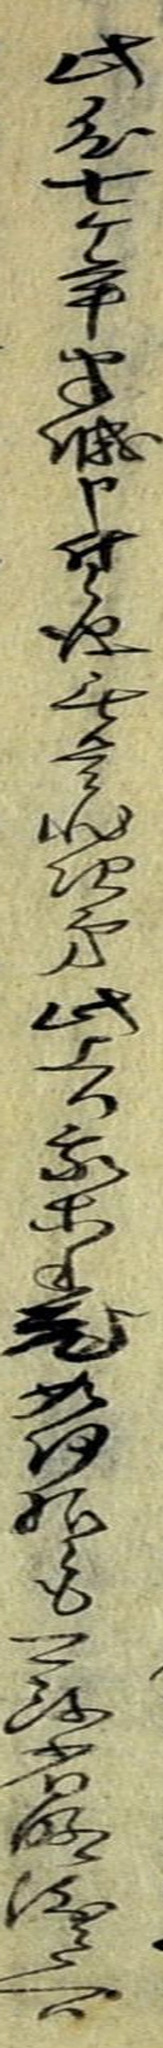此度七ケ年半減申付候無是非次第此上ハ我等手元如何様ニも可致省略儀ニ候へハ
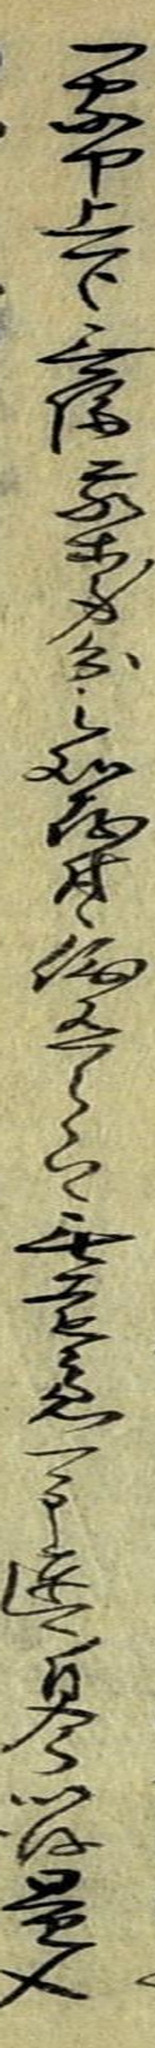一家中上下無拠我等身分之処存付候儀有之候ハヽ無遠慮可申達候自今以後量入
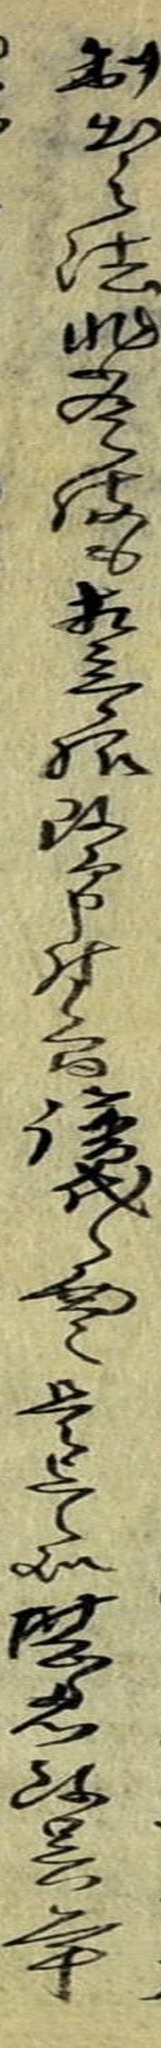制出之法非常之備も相立候様改而申付候間譜代之面々是迄之処堪忍致呉年
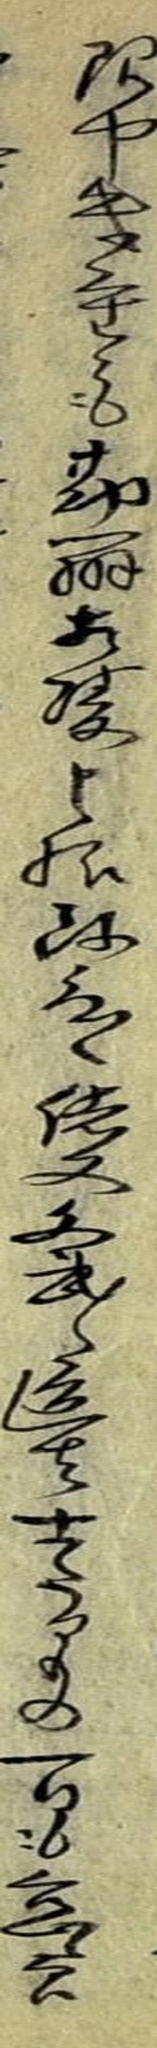限中幾重ニも勘弁相凌申候様致度候偖又文武之道者士たるもの一日も怠候而ハ
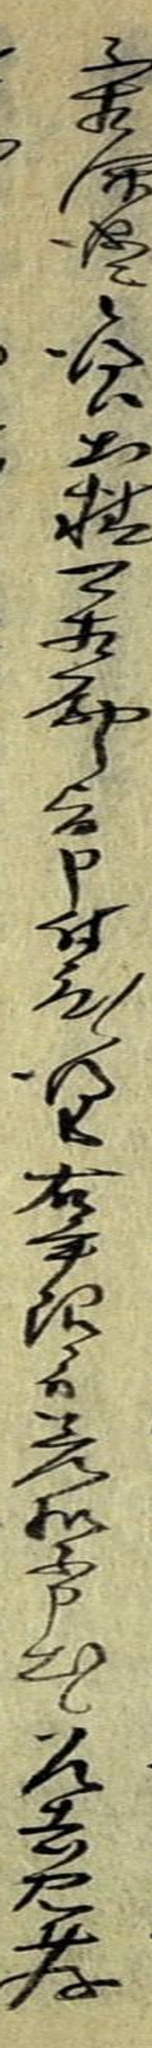不相済儀ニ候得ハ出精可相励旨申付度候得共右年限ニ付差扣不申出候乍去忠孝
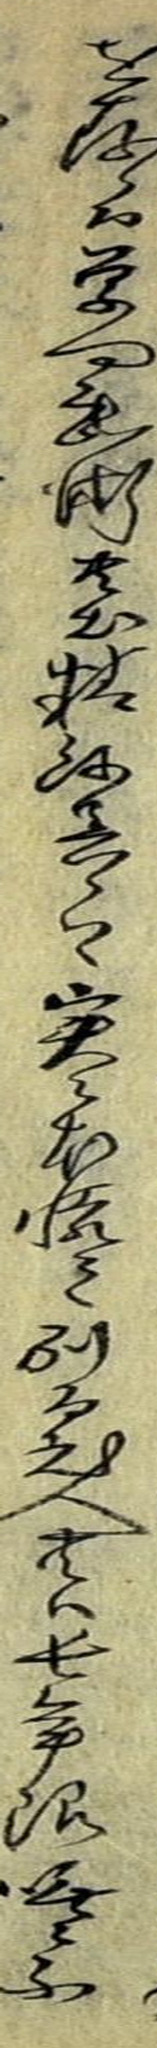を存候而学問武術共出精致呉候ハヽ実ニ本懐ニ候別而老人共ハ七年限り嘸ニ不
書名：命令之部 五
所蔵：福井県文書館 Fukui Prefectural Archives
